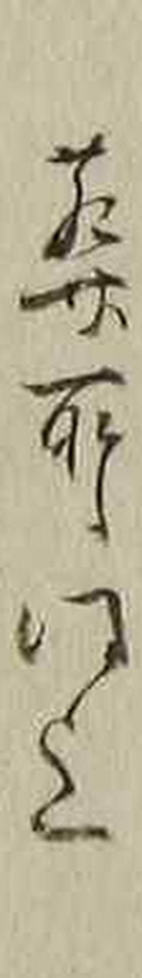葬所同上
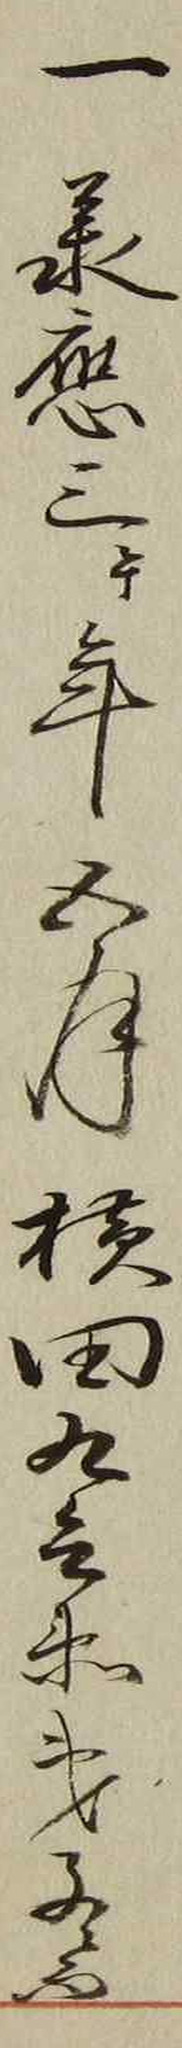一承応三午年五月横田九兵衛弟子ニ而
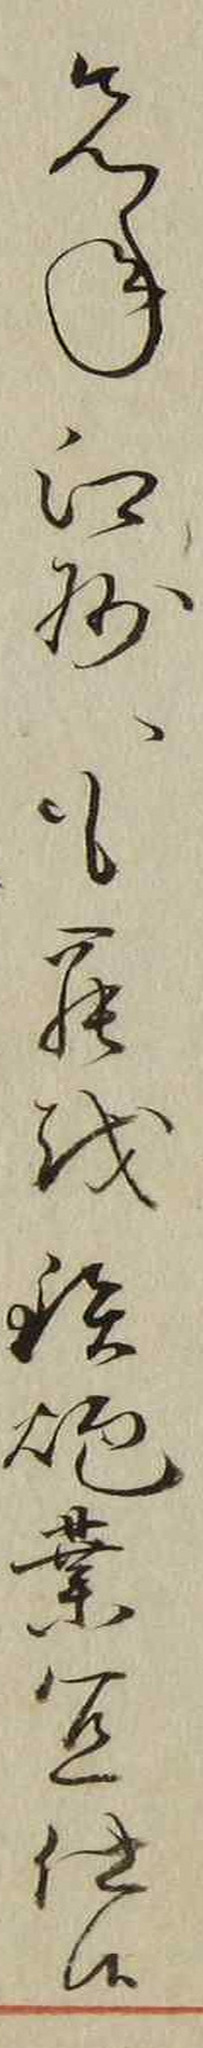先年江州へも罷越鉄炮業宜仕候
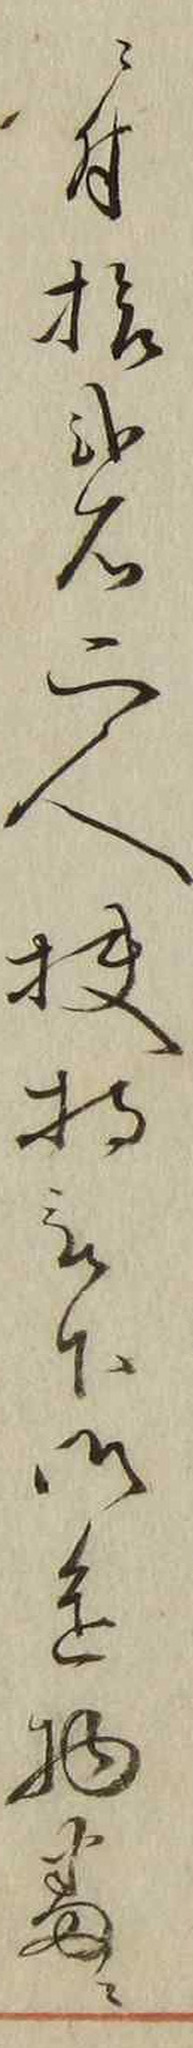ニ付拾弐石二人扶持被下御進物番ニ

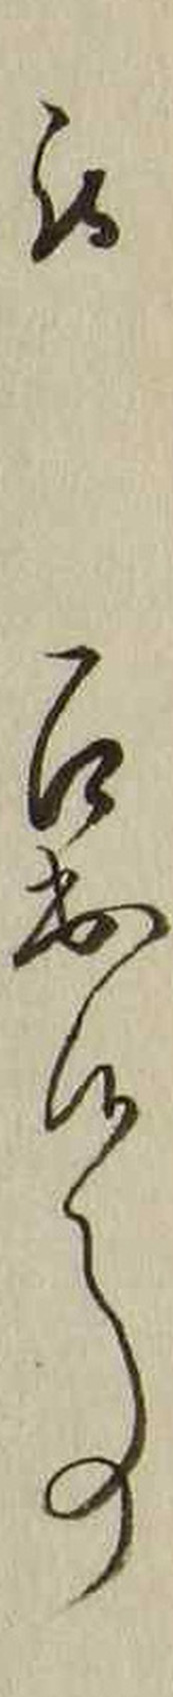被召出候事
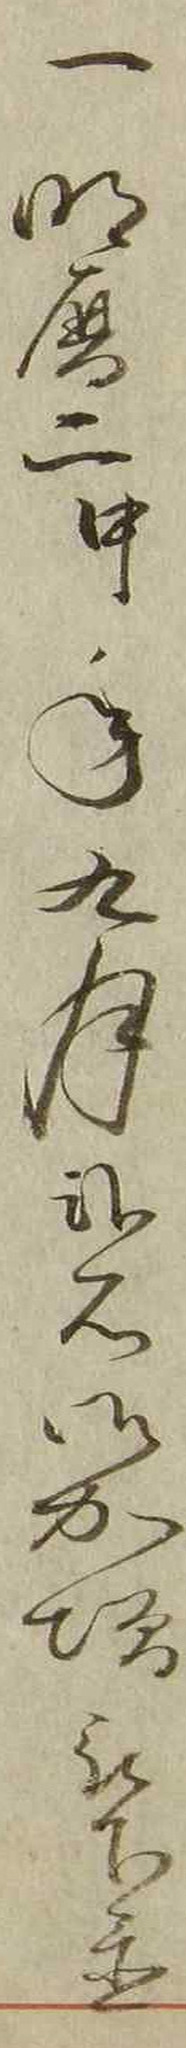一明暦二申年九月弐石御加増被下置
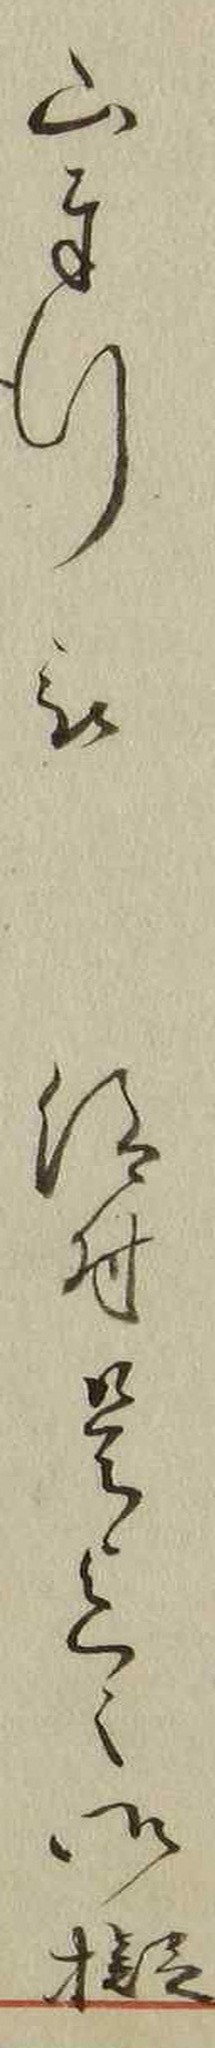山奉行被仰付是迄之御擬
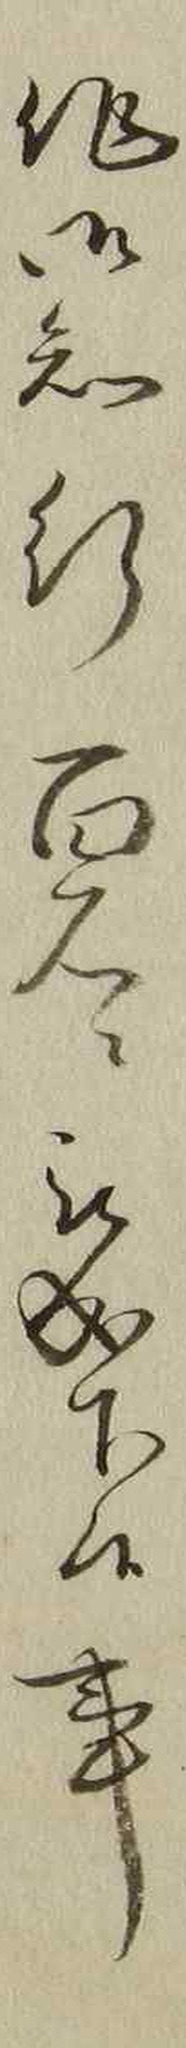作御知行百石ニ被成下候事
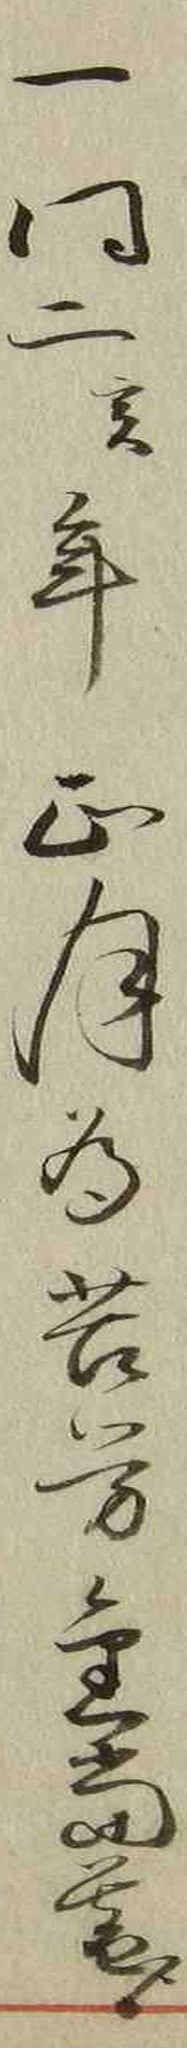一同二亥年正月為苦労金当暮ゟ
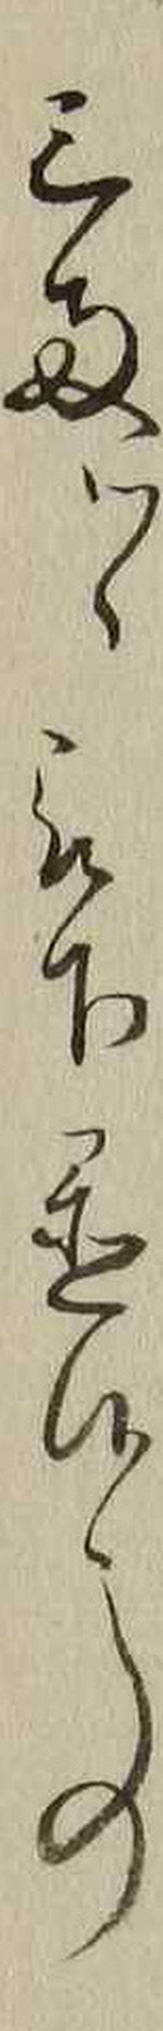三両ツヽ被下置候事
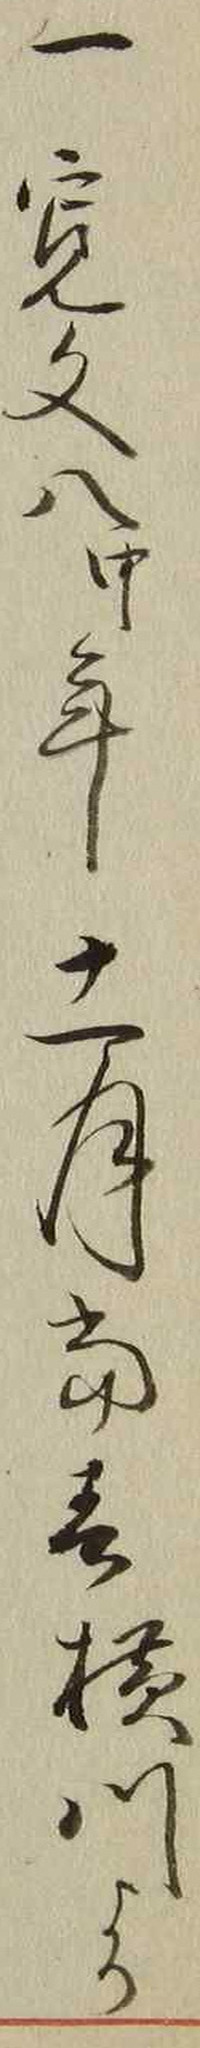一寛文八申年十一月当春横川より
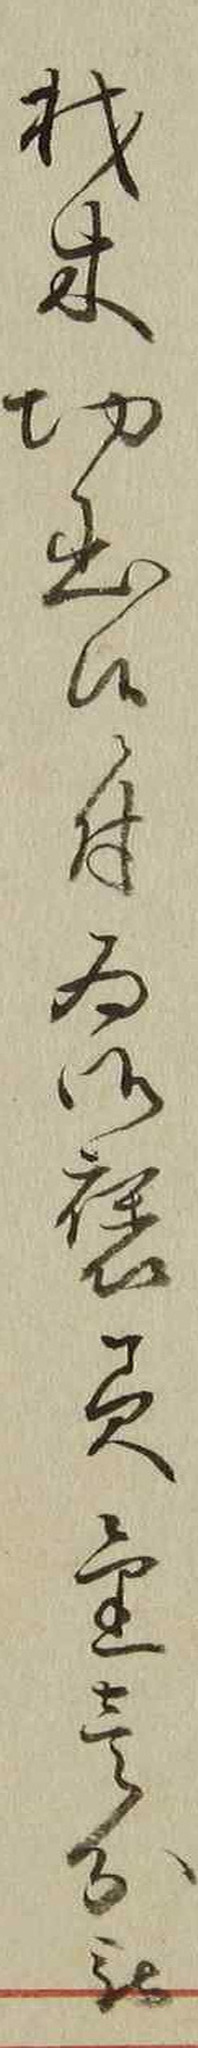材木切出候ニ付為御褒美金壱分被
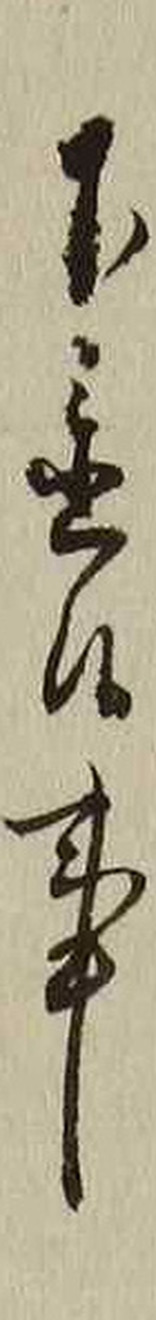下置候事
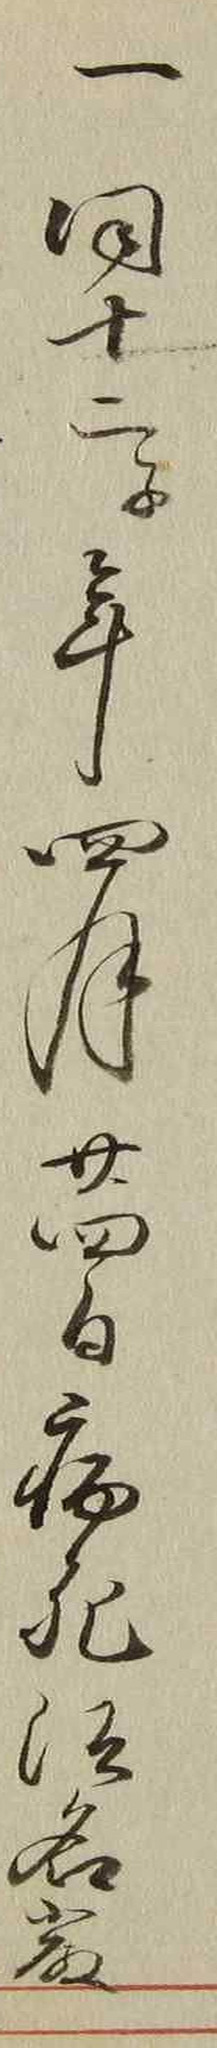一同十二子年四月廿四日病死法名厳
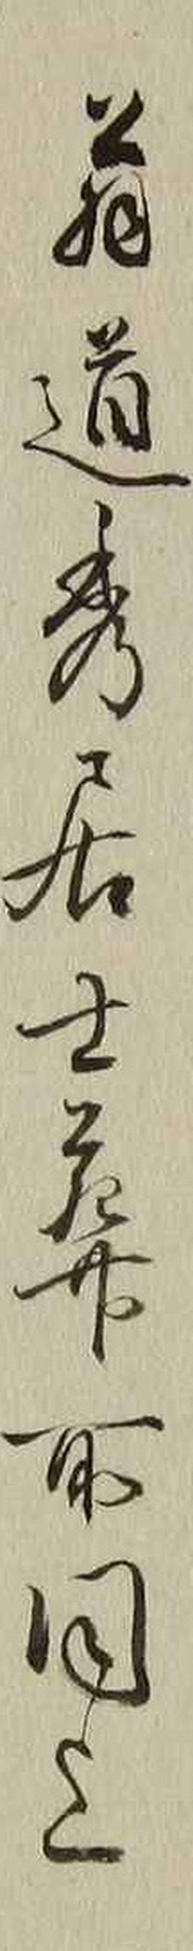翁道秀居士葬所同上
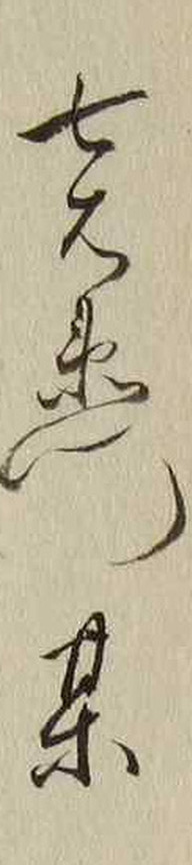七右衛門某
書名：諸士系譜　巻之2　い之部2
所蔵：会津若松市立会津図書館
